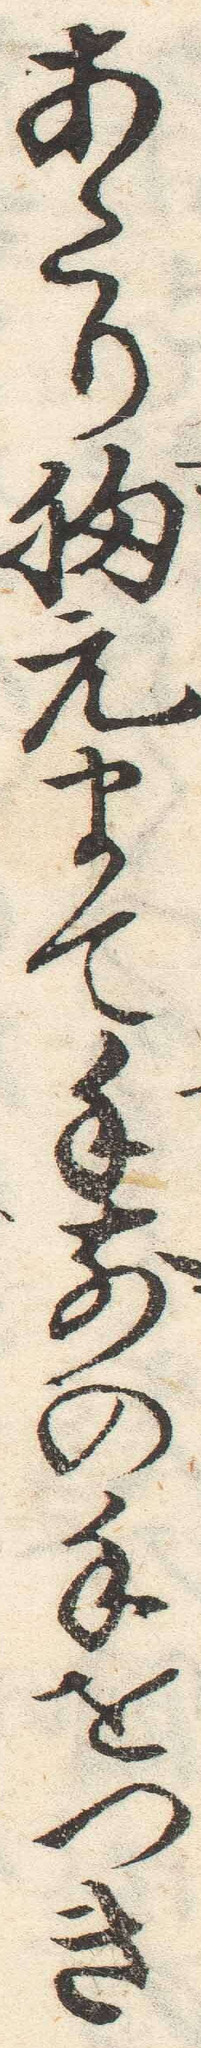あたり胸元まて手前の手をつき
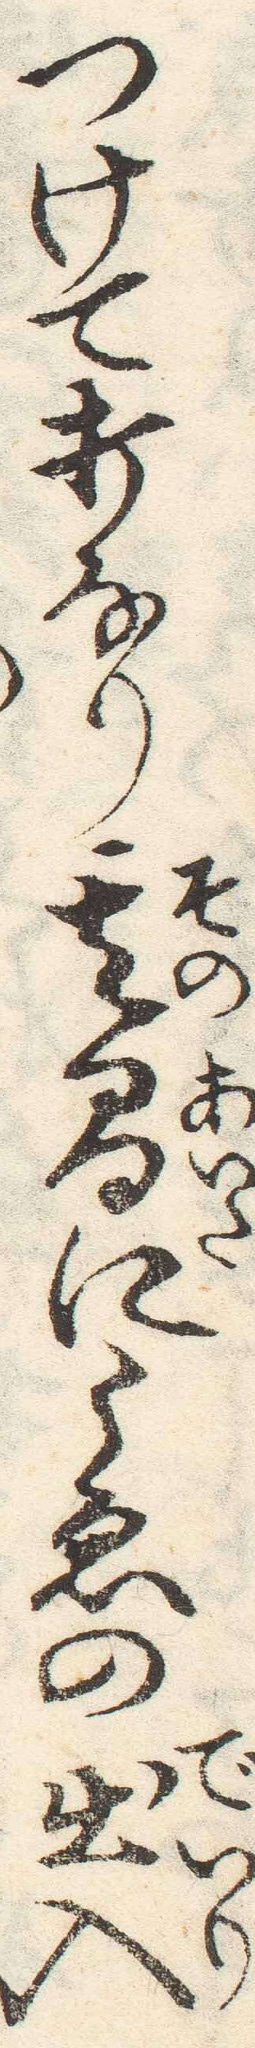つけて打なり其間にこゑの出入
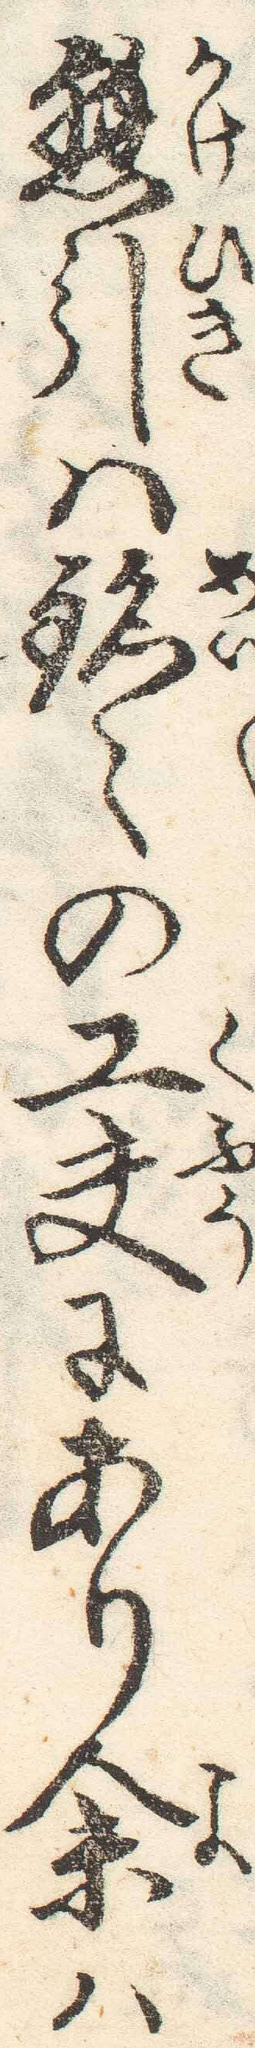懸引は銘々の工夫にあり余は
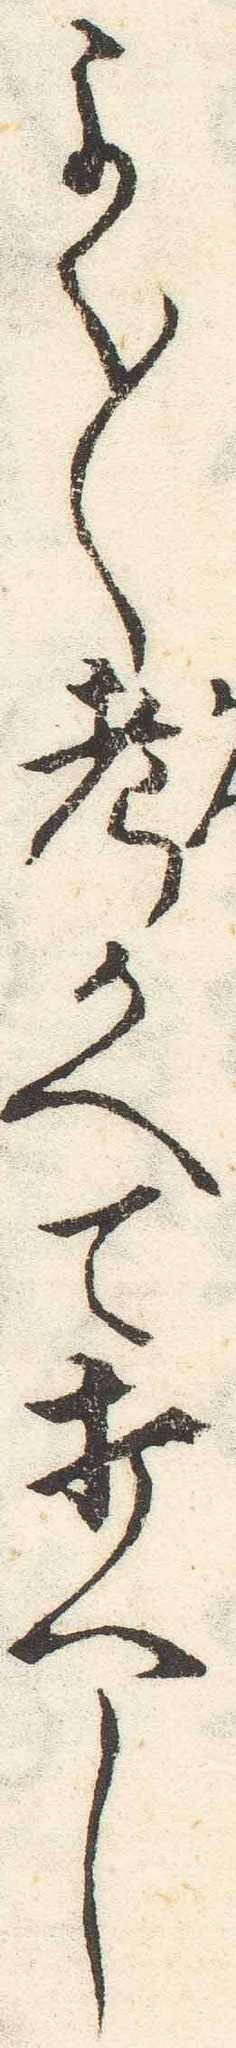よく〳〵考かへて打へし
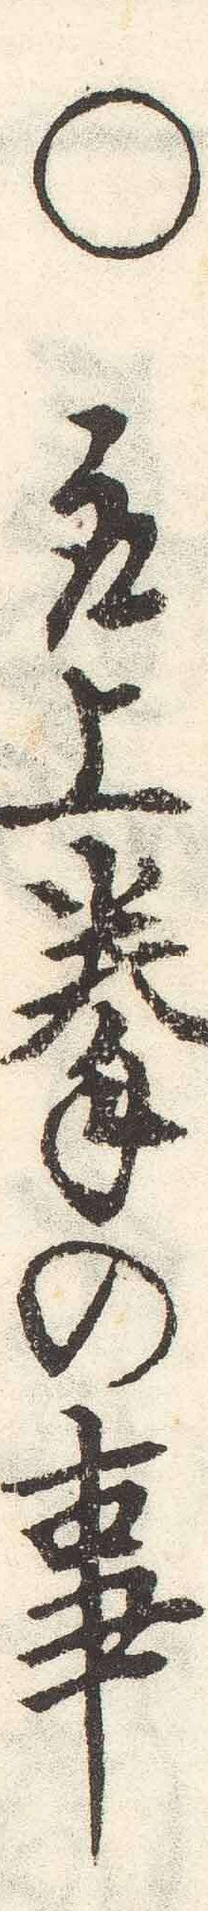○取上拳の事
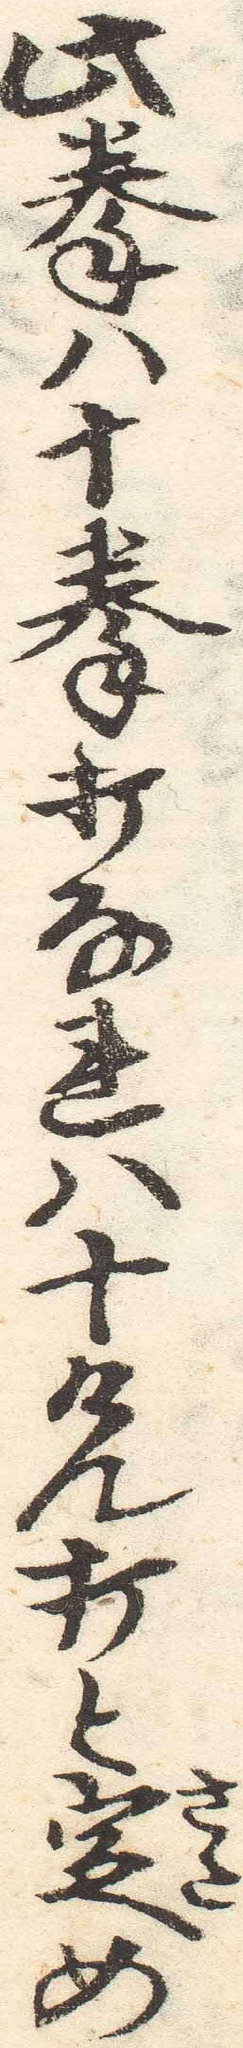此拳は十拳打なれは十けん打と定め
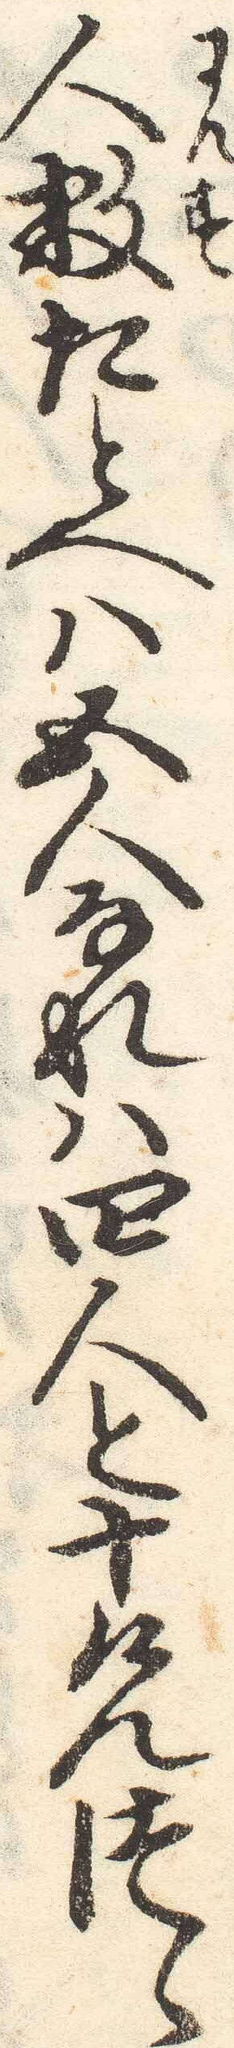人数たとへは五人なれは四人と十けんつゝ
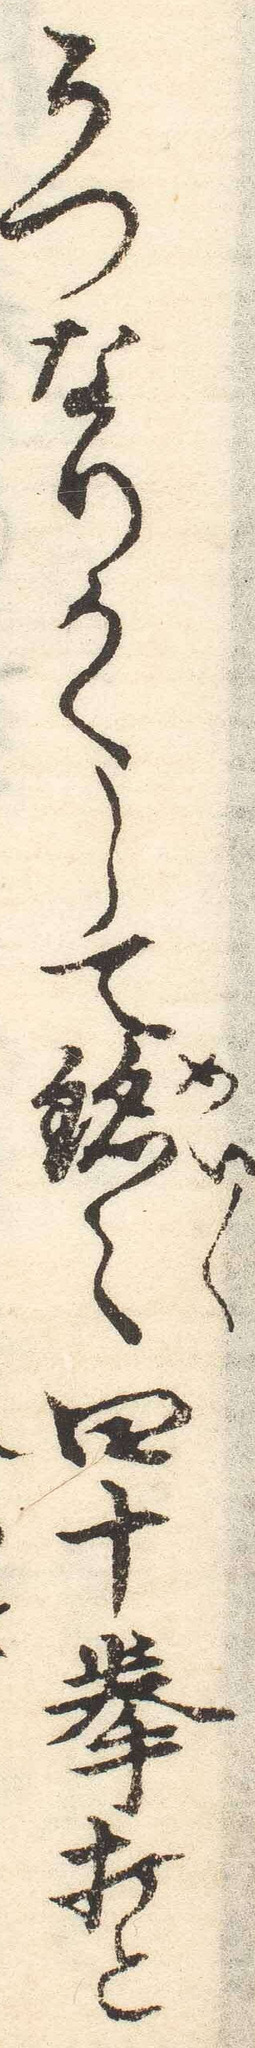うつなりかくして銘々四十拳打と
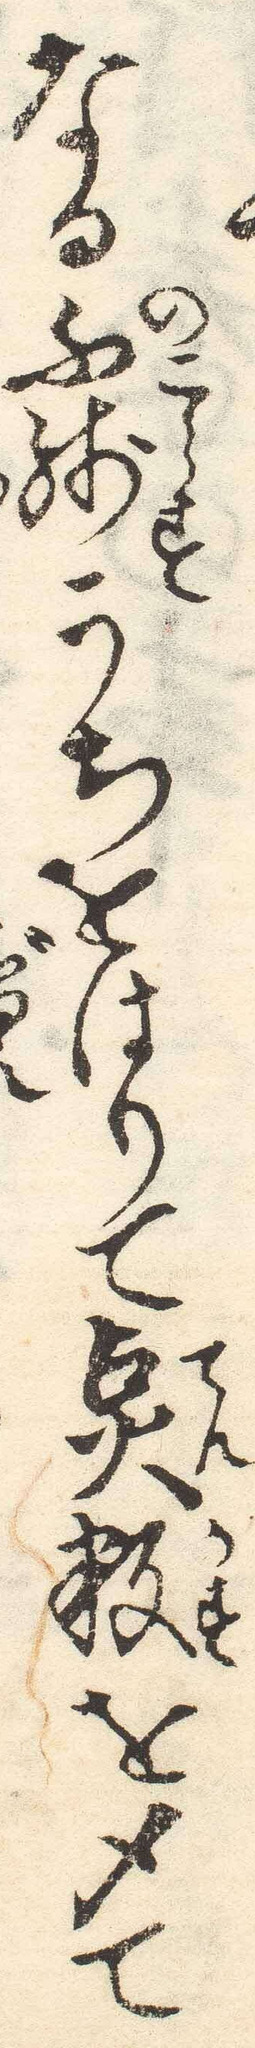なる不残うちをはりて点数を〆て
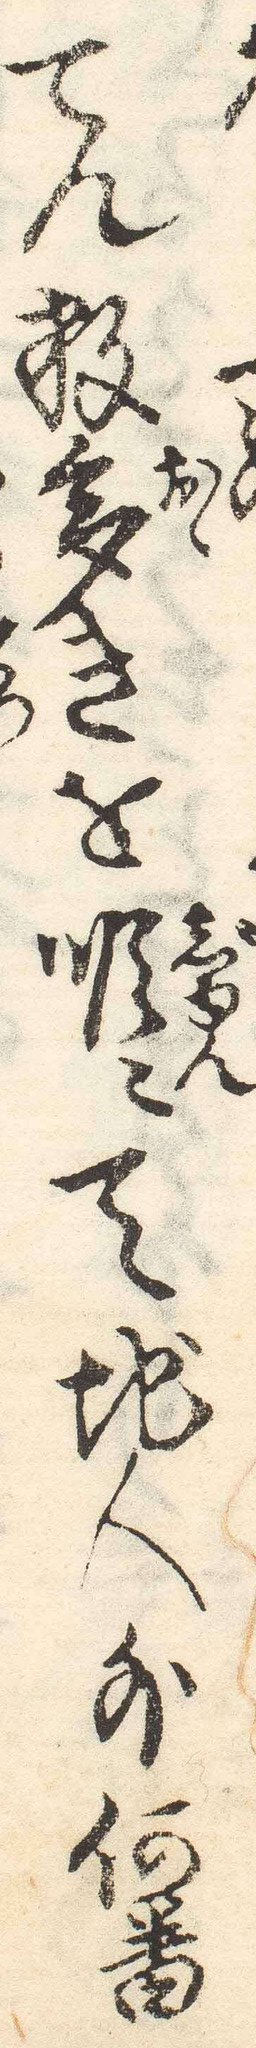てん数多きを順に天地人外何番
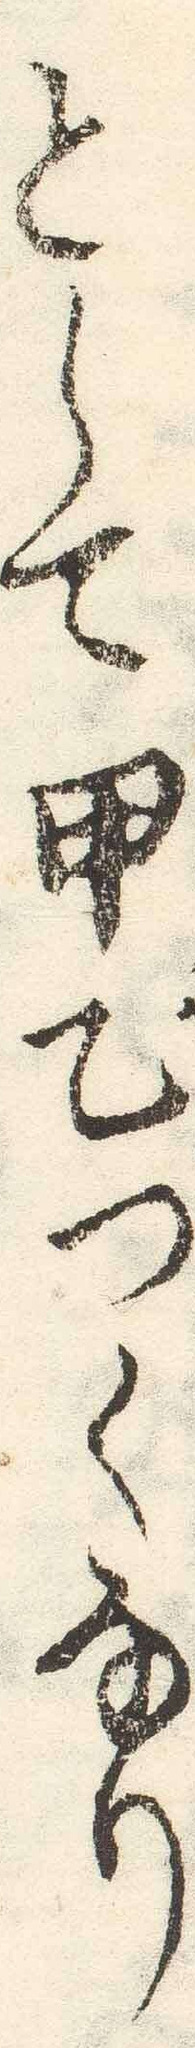として甲乙つくなり
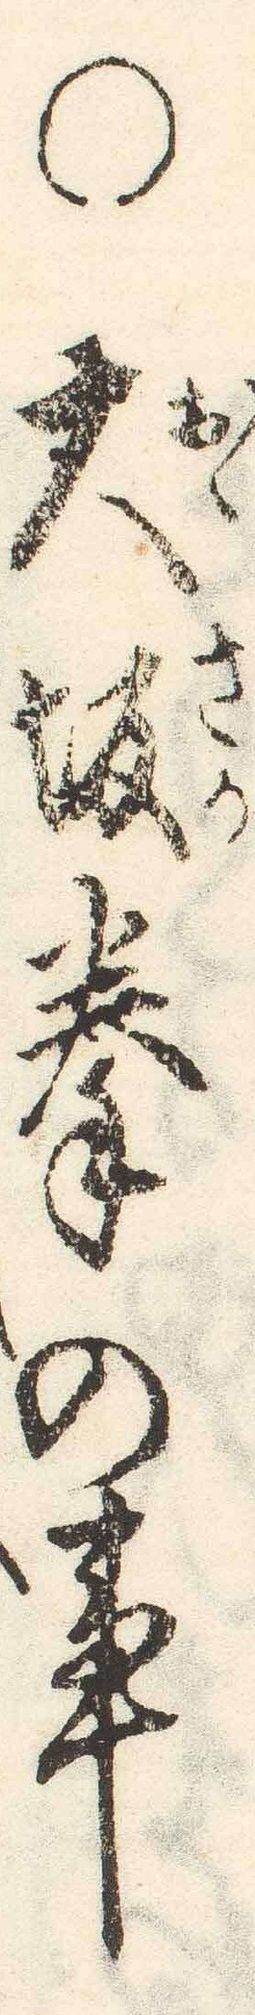○大坂拳の事
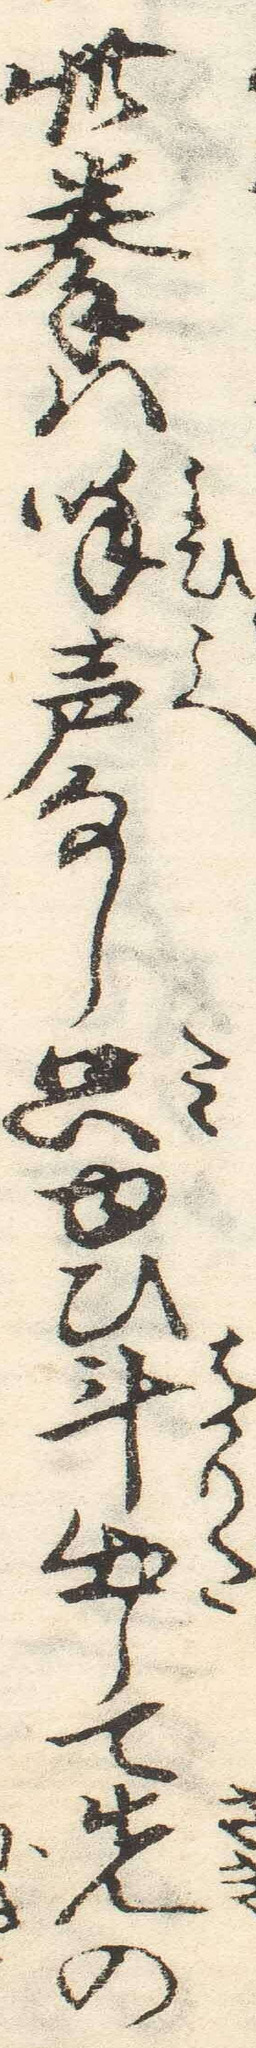此拳は呼声なし只ゆひ斗出して先の
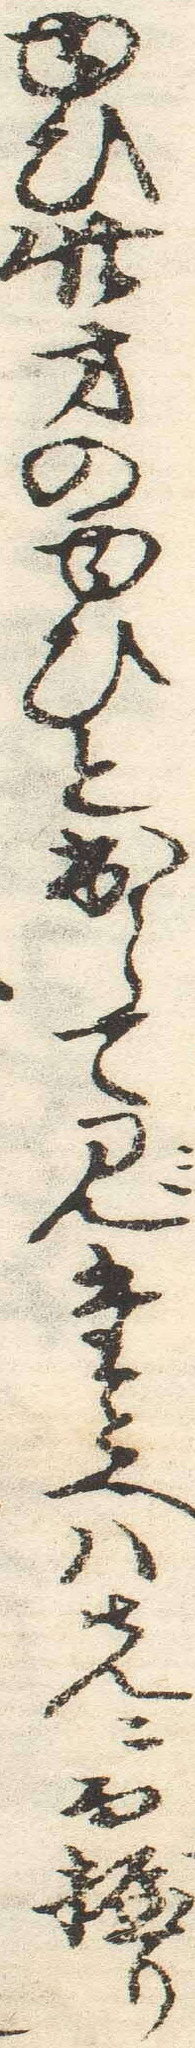ゆひ此方のゆひと出して見たとへは先にて握り
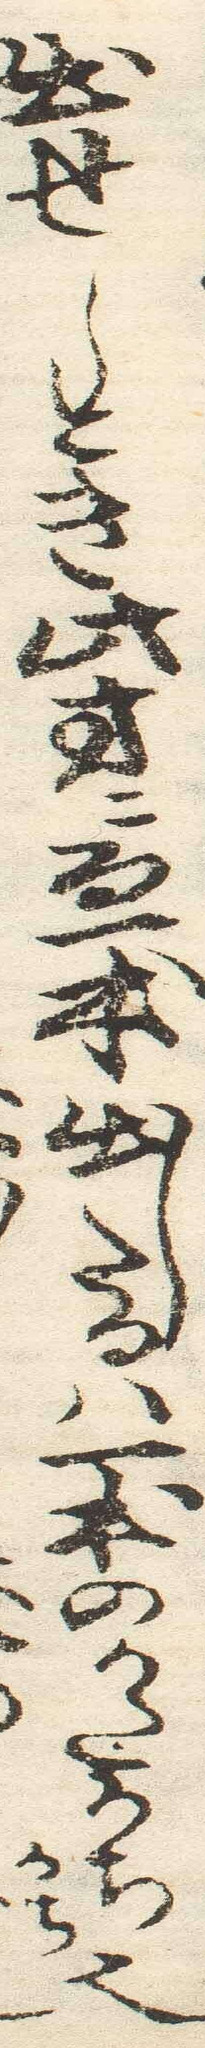出せしとき此方にて一本出したるは一本のかたかち也
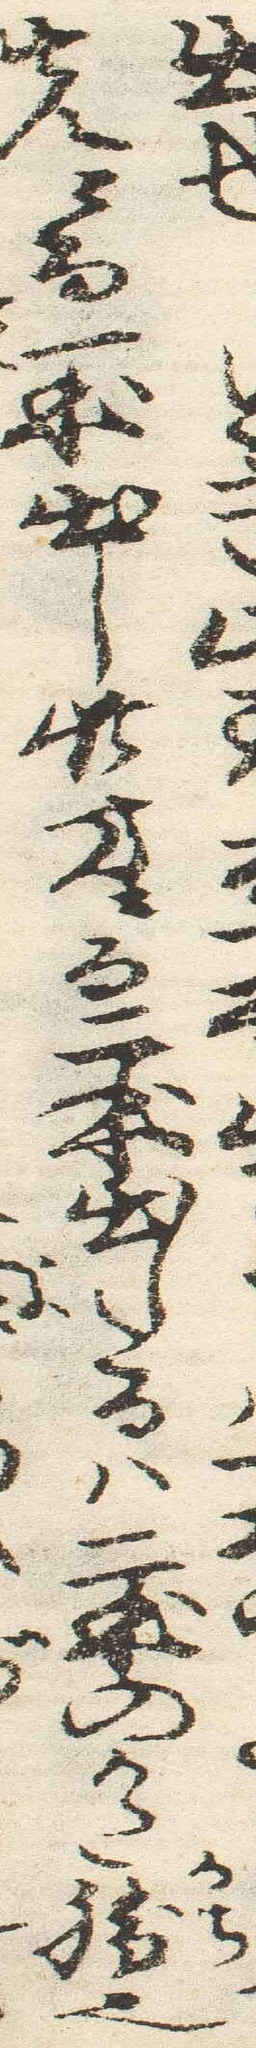先にて一本出し此方にて二本出したるは二本のかた勝也
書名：拳独稽古
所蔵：東京学芸大学附属図書館 国文学研究資料館
